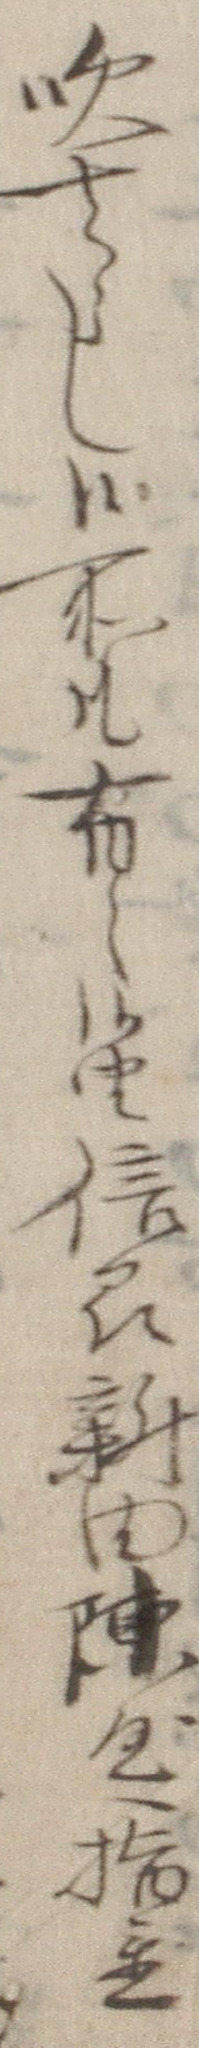吹さらし候所も有之候由信州新田陳屋へ指置
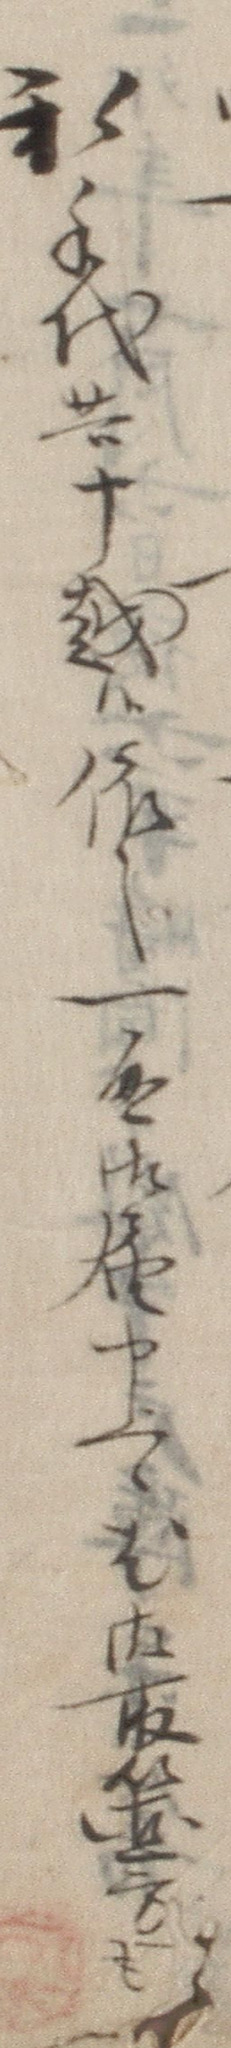私手代共申越候依之一通御届申上候尤御取置方へも
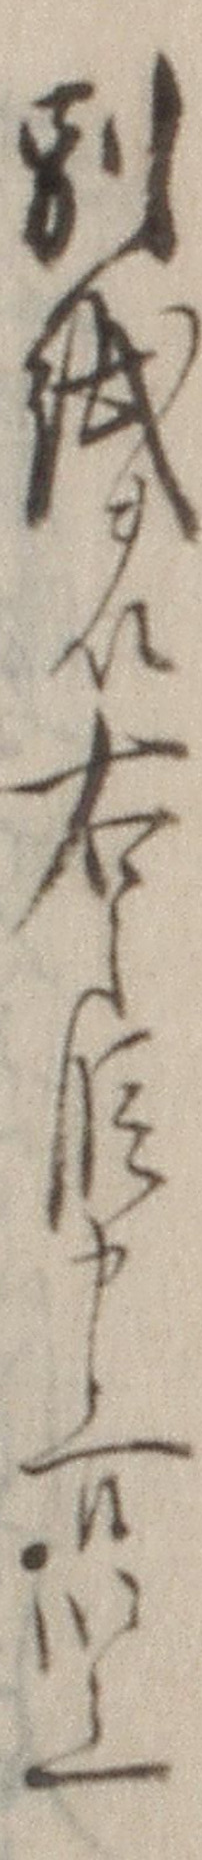別紙ヲ以右之段申上候以上
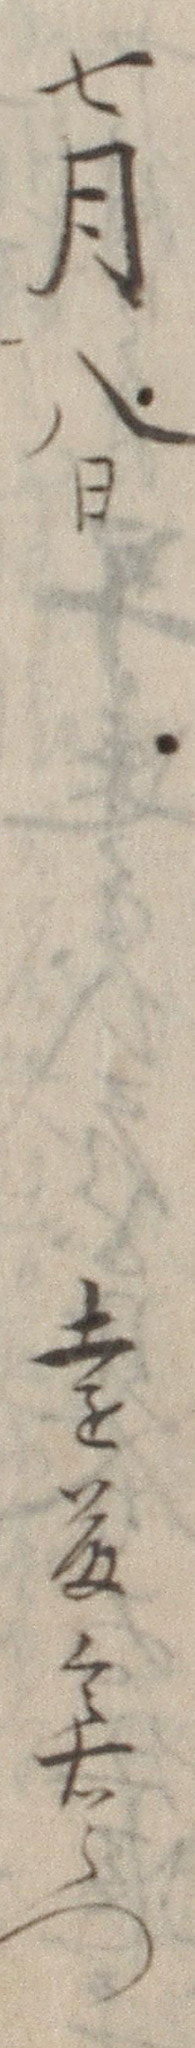七月八日遠藤兵右衛門
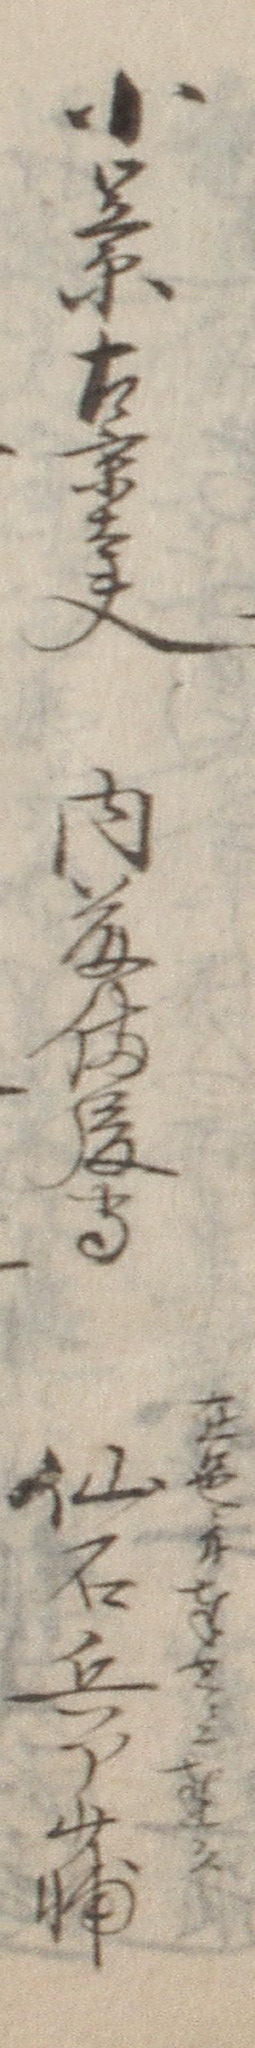小笠原右京太夫内藤備後守仙石兵部少輔
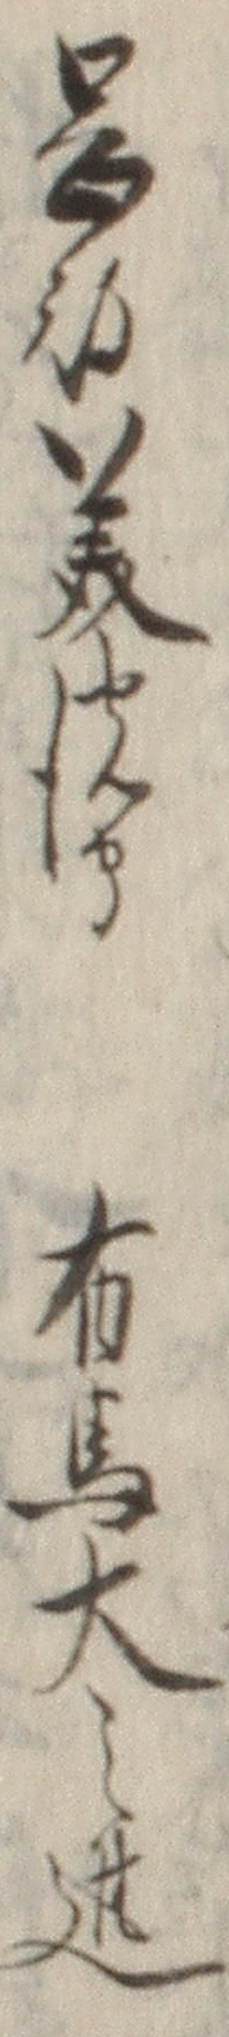岡部美濃守有馬大之進
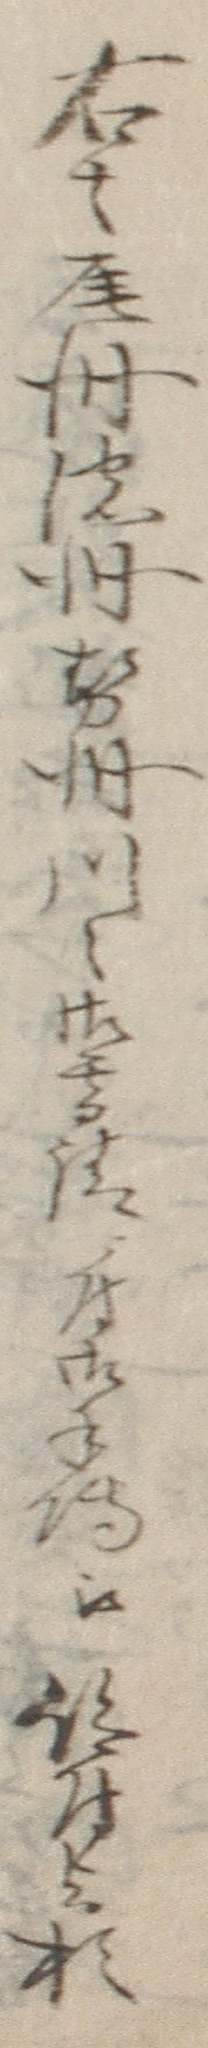右者尾州濃州勢州川之御普請ニ付御手伝被仰付旨於
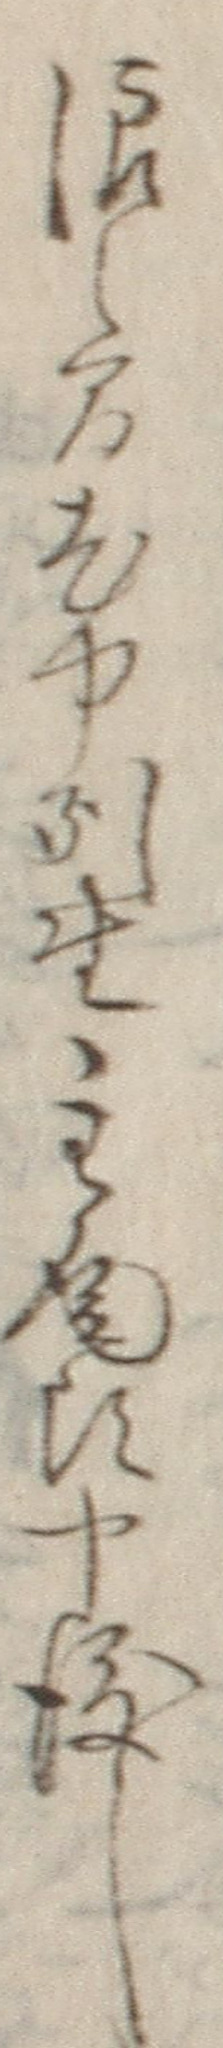浪之間老中列座主殿頭申渡
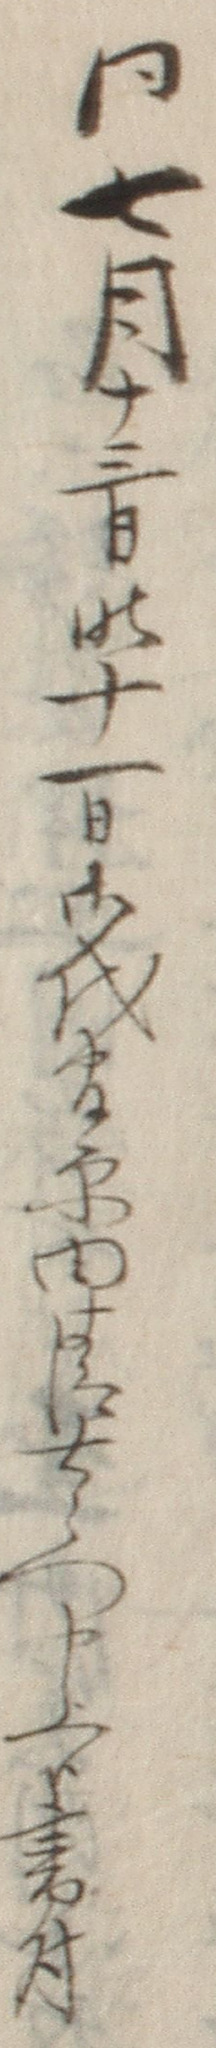同七月十三日昨十一日御代官原田清右衛門申上候書付
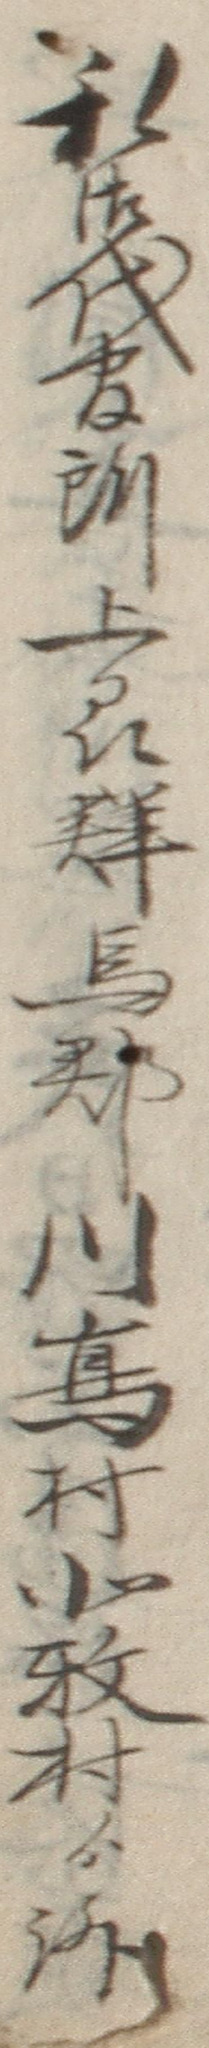私御代官所上州群馬郡川島村北牧村ゟ訴

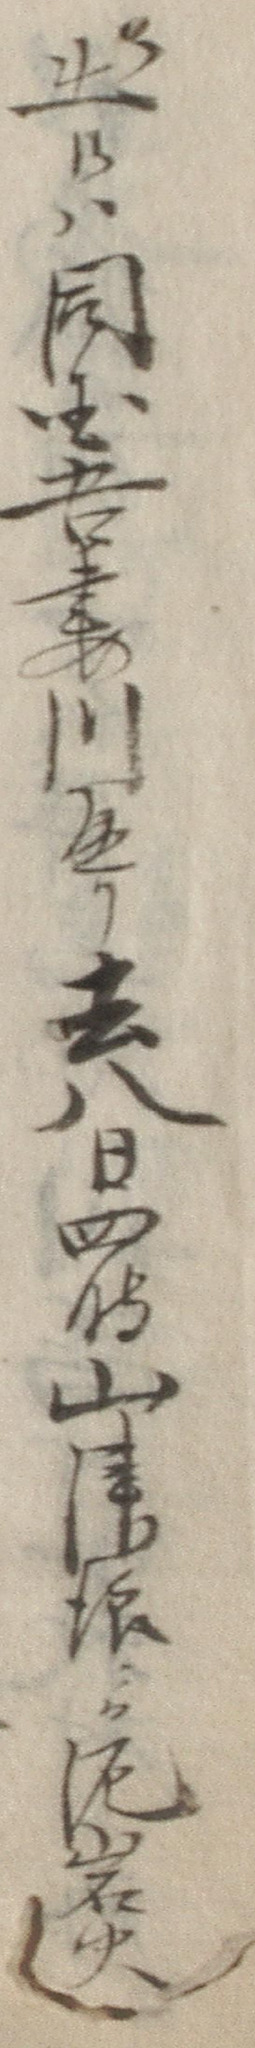出候は同国吾妻川通り去八日四時山津浪ニ而泥岩火
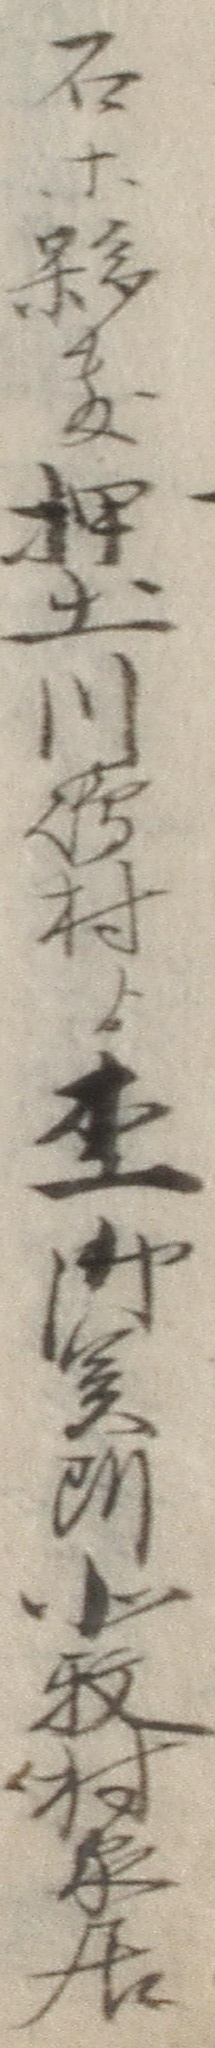石等夥敷押出川嶋村ゟ杢御関所北牧村家居
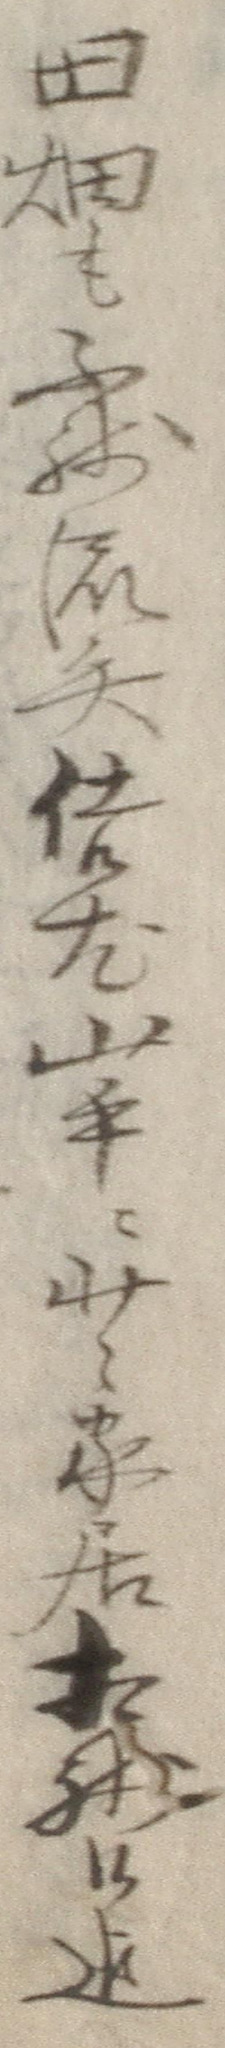田畑も不残流失仕候尤山中に少々家居相残候迄
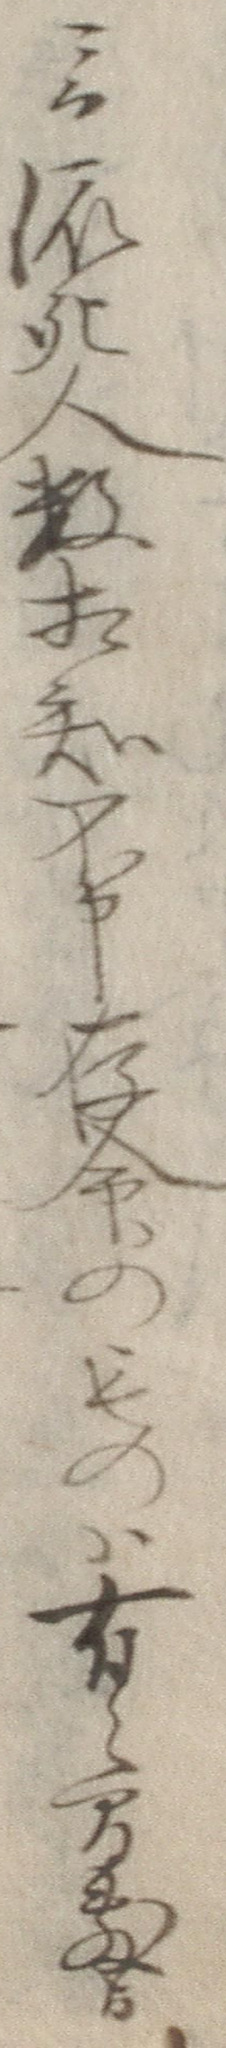ニ而流死人数相知不申存命のものは有之間敷旨
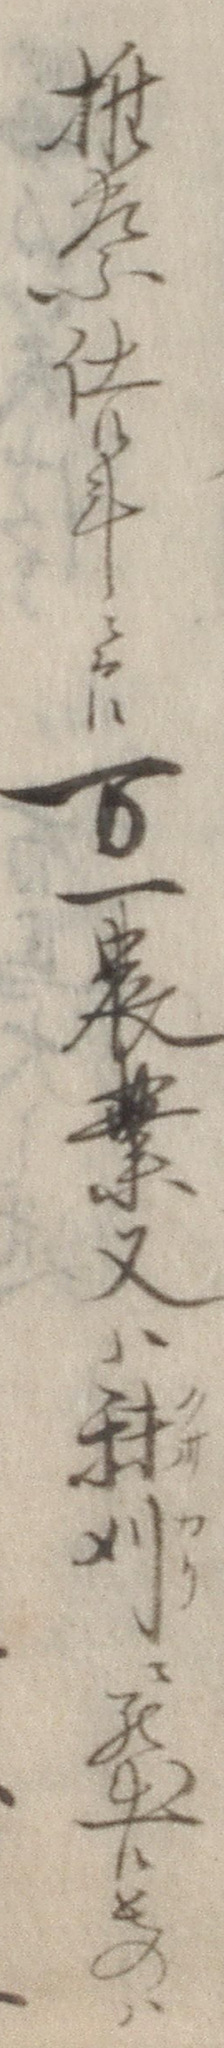推察仕候斗ニ而は万一農業又は秣刈ニ罷出候ものは
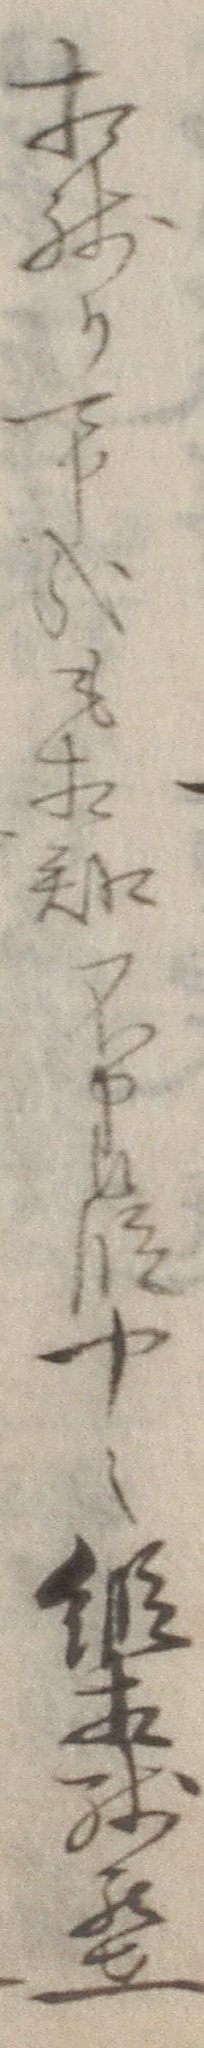相残り可申哉も相知不申候段申之縦相残罷在
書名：[諸国災害記録]
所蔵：東京大学地震研究所図書室 Earthquake Research Institute Library, The University of Tokyo, JAPAN
